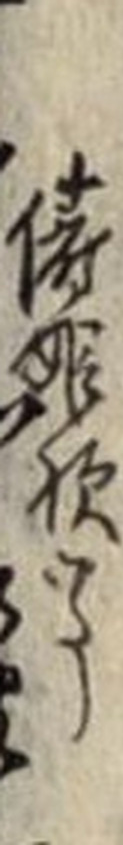寿姫様御事
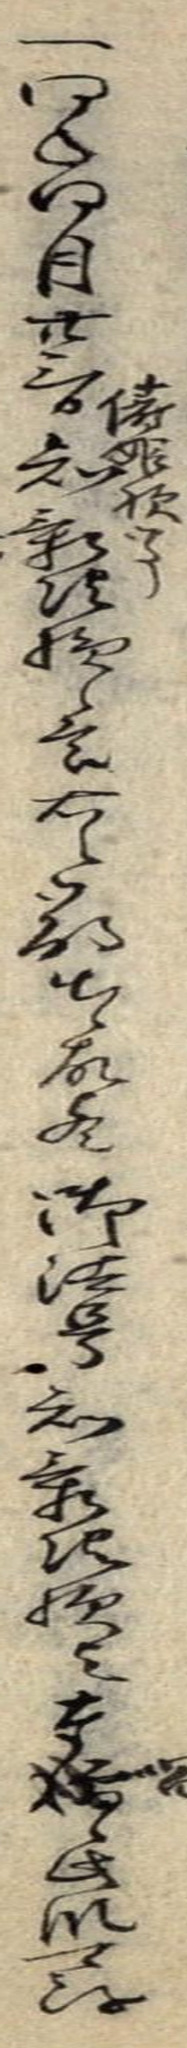一同年同月廿三日儔姫様御事知新院様之節右之御触出候故歟御法号知新院様と奉唱候此段可改
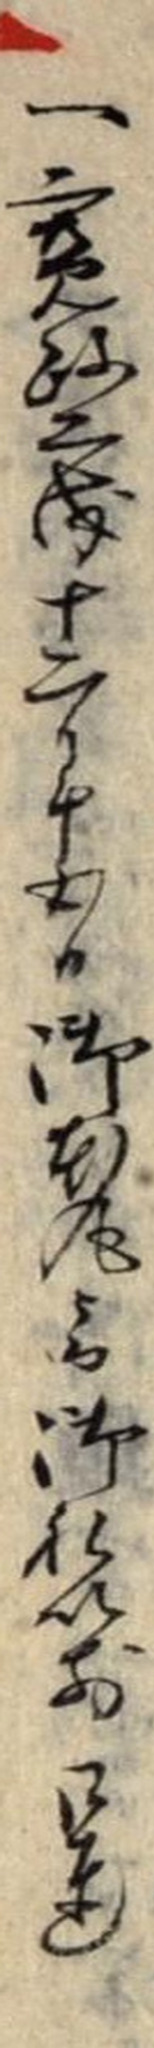一寛政二戌十二月十五日御本丸に而御礼以前口達

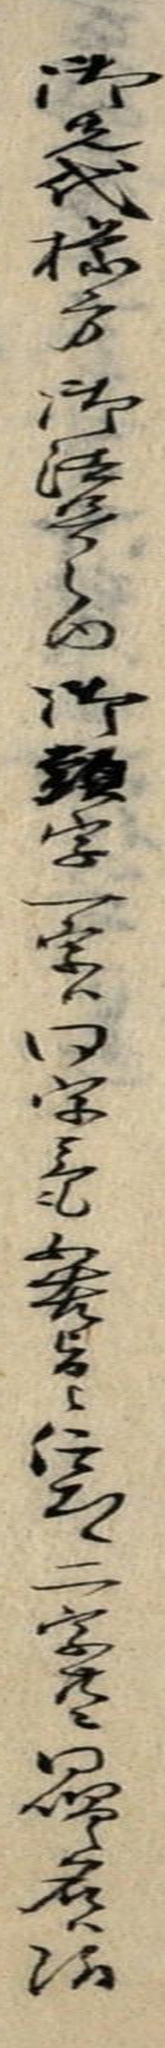御先代様方御法号之内御頭字一字は同字に而も不苦旨被仰出候二字共に同唱之名は附
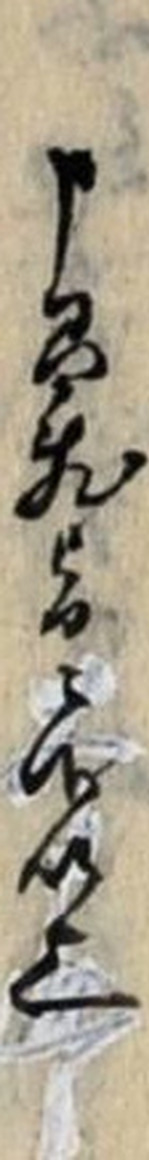申間敷旨に候以上
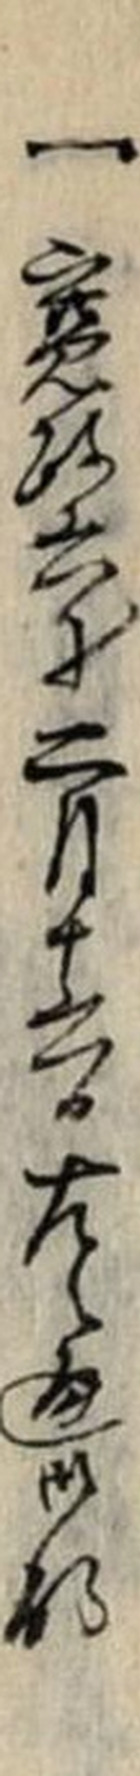一寛政六寅二月十六日左之通御触
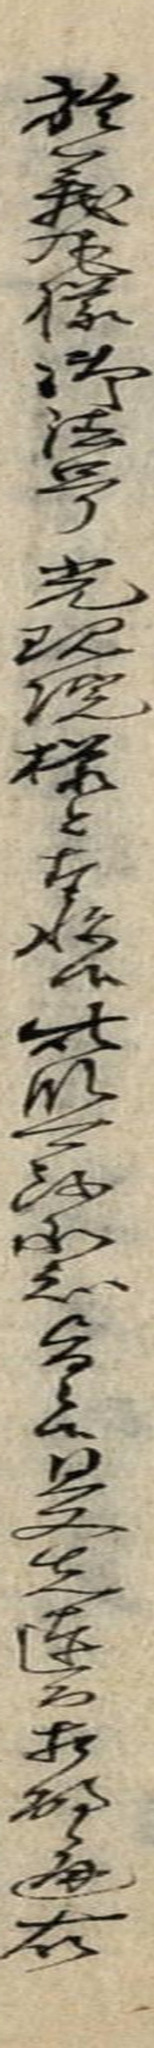於義丸様御法号光現院様と奉称候此段可致承知旨に候且又先達而相触候通右
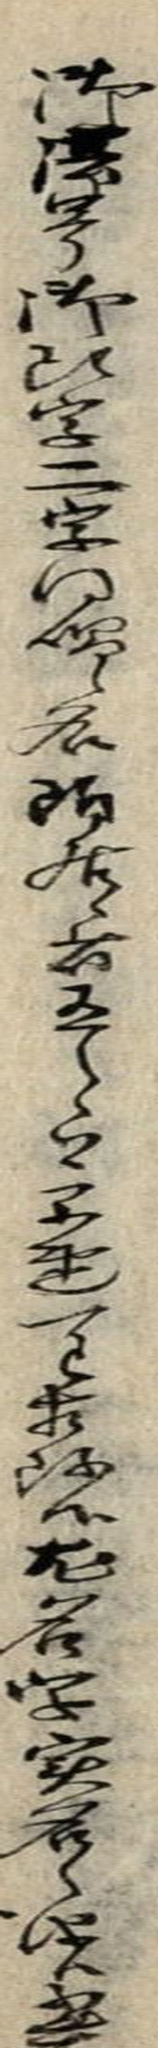御法号之御頭字二字同唱之名附居候者有之候はゝ早速可被相改候尤名字実名之儀は不苦
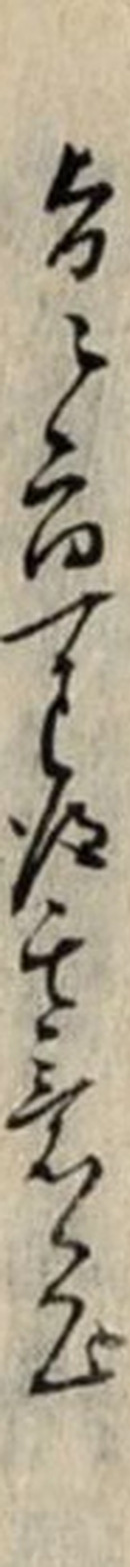旨に候間可被得其意候以上
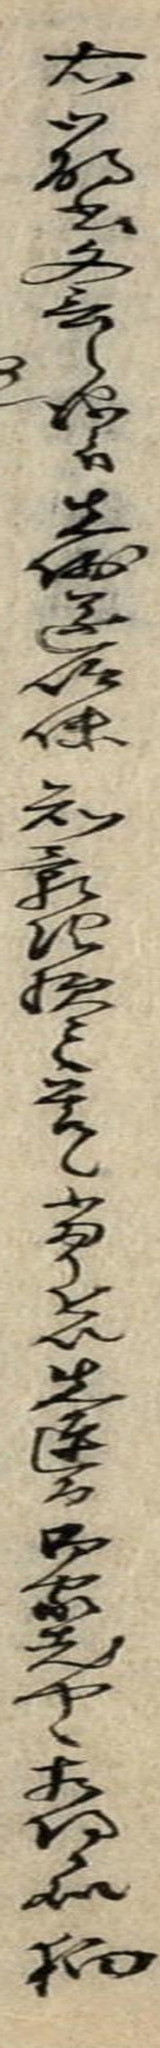右御触書文言之儀に付先例遂吟味知新院様之節之当りを以先達而御家老中へ相伺候処狛
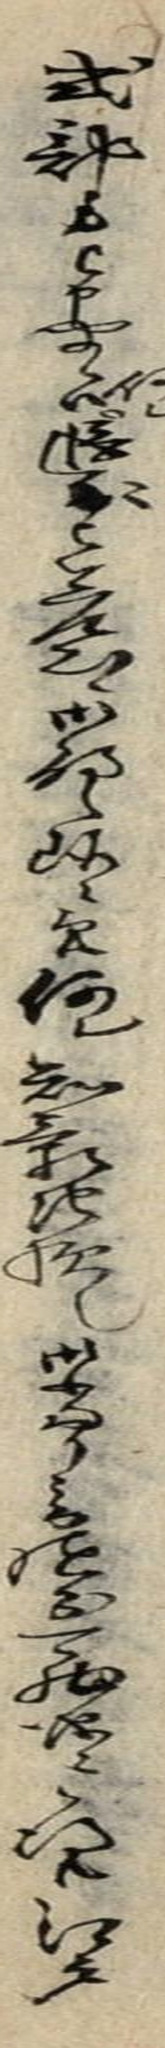式部方被申聞候は何れ追々被差出候御触之趣に而は何れ知新院様之御当りに而随分可然儀に候得共江戸
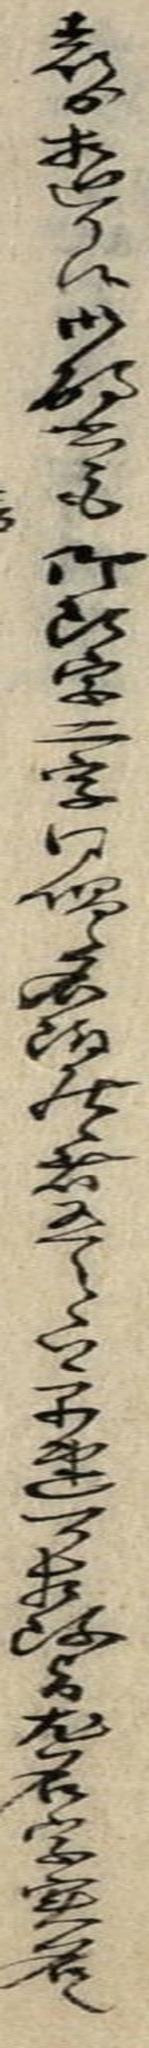表ゟ相廻り候御触書にも御頭字二字同唱名附居候者有之候はゝ早速可相改旨尤名字実名之
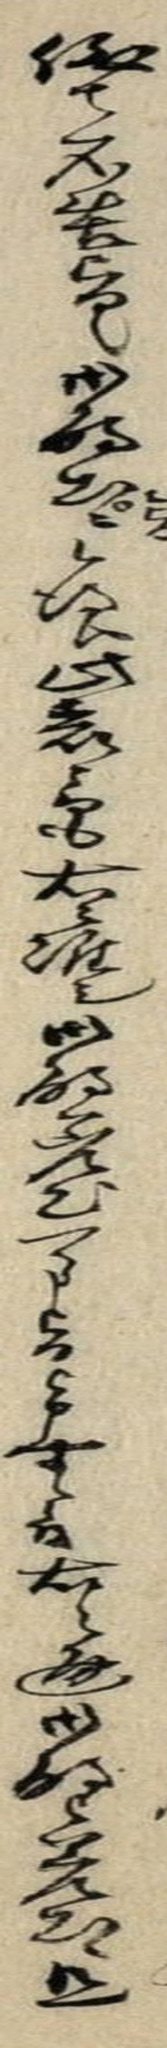儀は不苦旨之御触出候旨に候得は此表に而も右に准し御触差出可申旨被申聞候に付右之通御触被差出候且
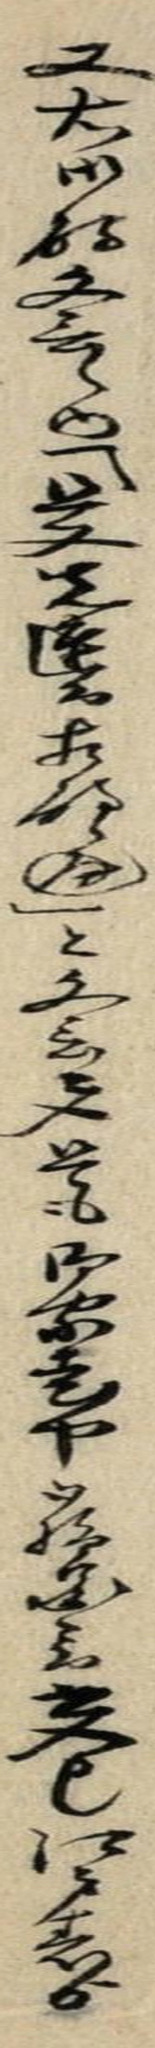又右御触文言之内「且又先達而相触候通」と文言に入是も御家老中御指図に而書入申候江戸表ゟ
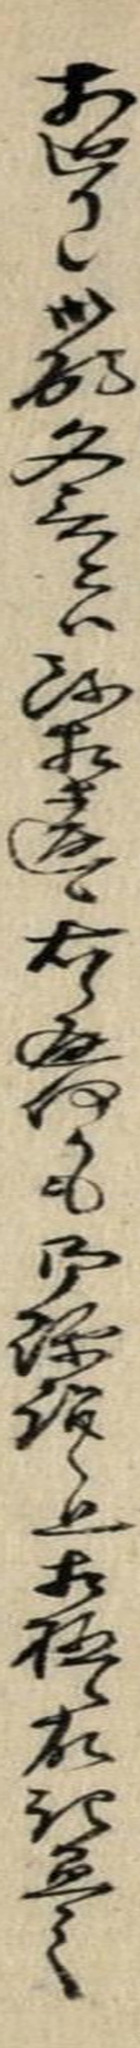相廻り候御触文言とは致相違候右之通何れも御評議之上相極候故記置之
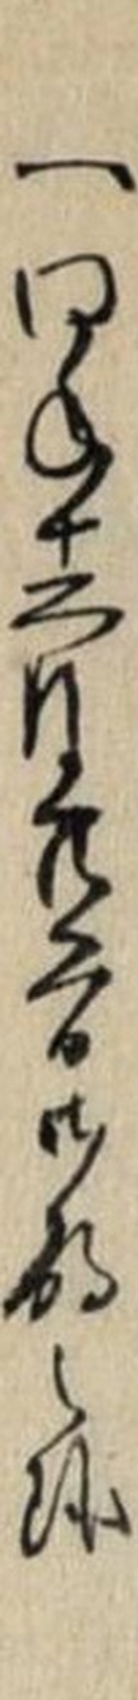一同年十二月廿二日御触之趣
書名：蒐輯之部
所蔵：福井県文書館 Fukui Prefectural Archives
